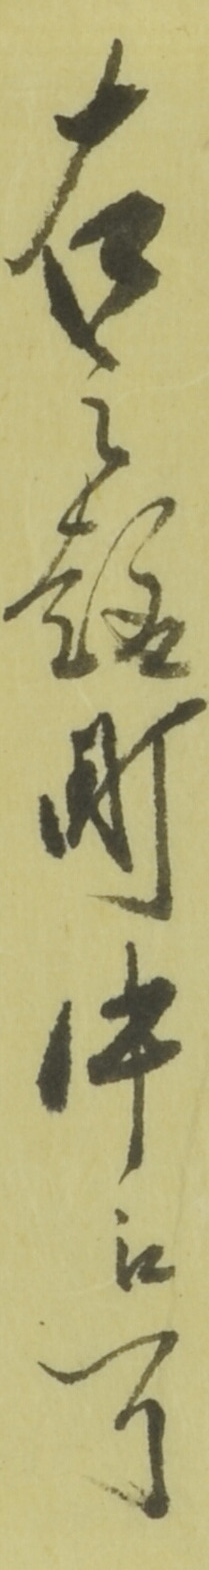右之趣町中江可
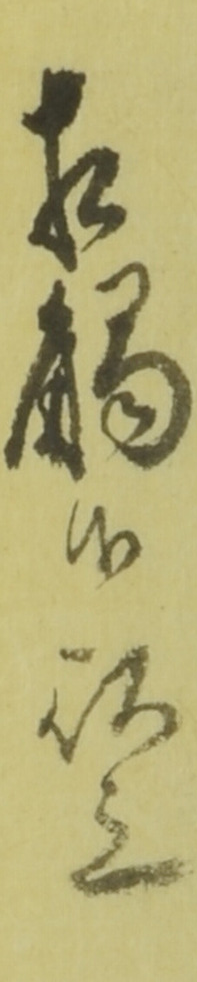相触候以上
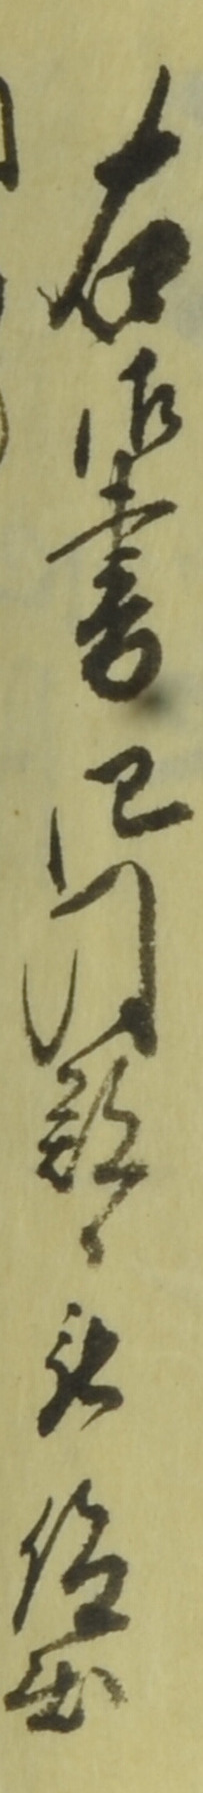右御書四月郡候被仰出
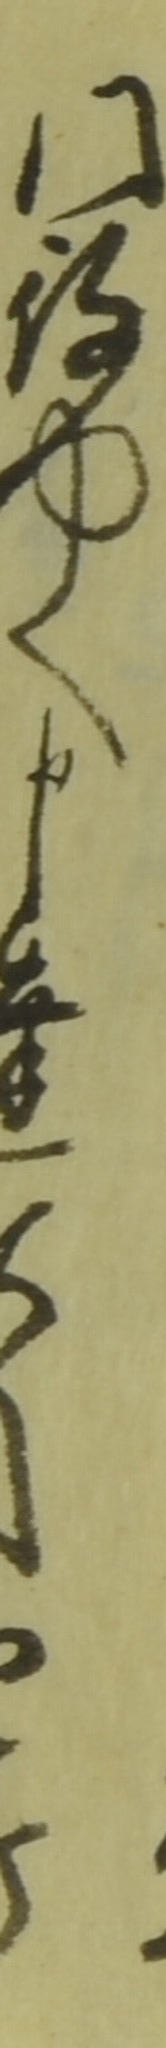同役ゆへ申達行司霜町

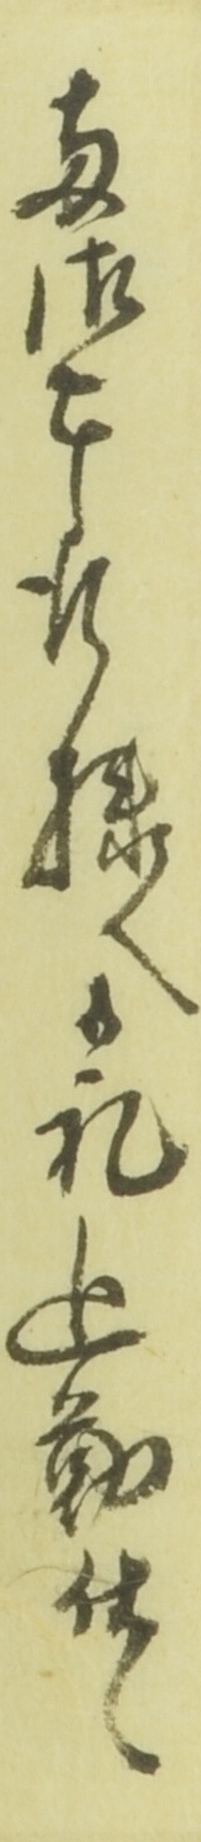両御様へ御礼迄勤仕候
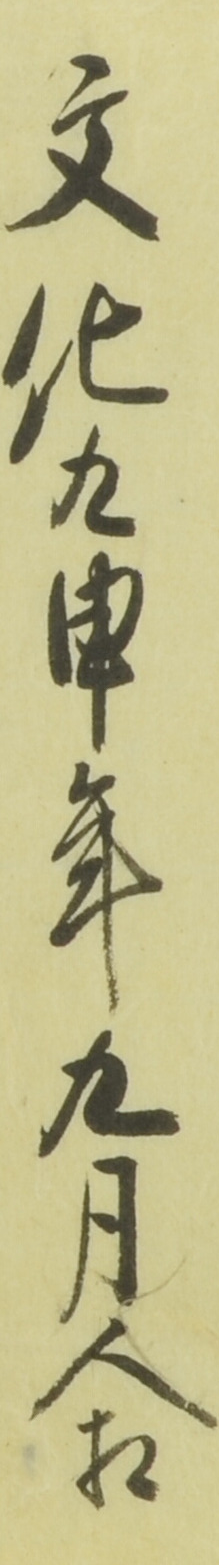文化九申年九月人相手
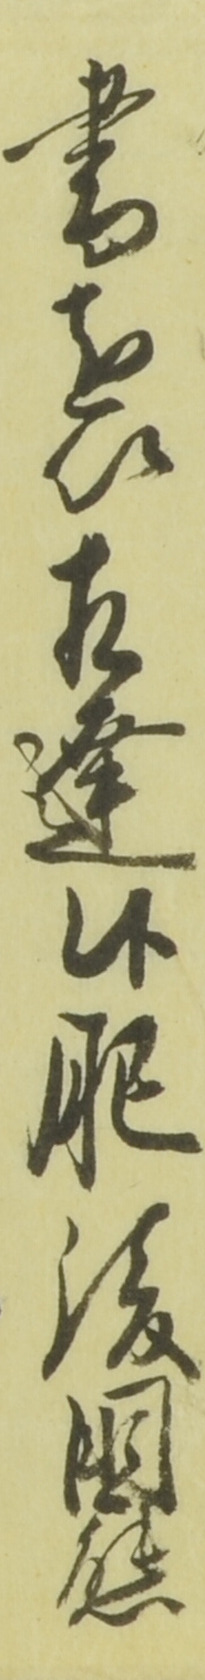書を以相達候肥後国熊
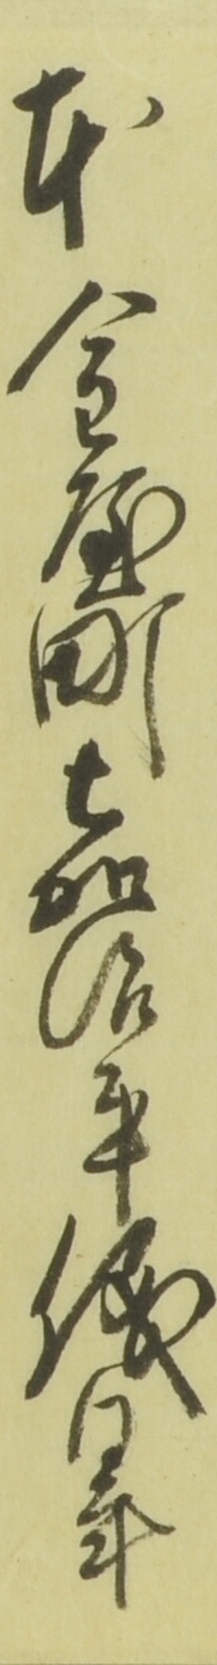本金屋町嘉治平儀同年
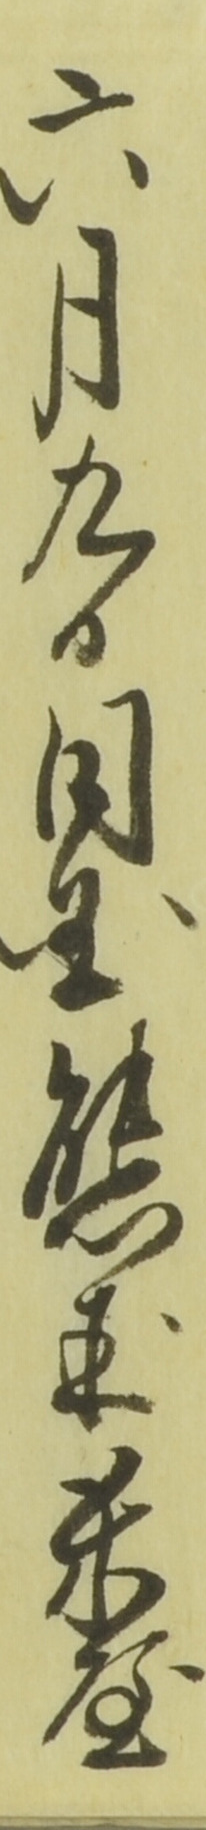六月九日同国熊本米屋
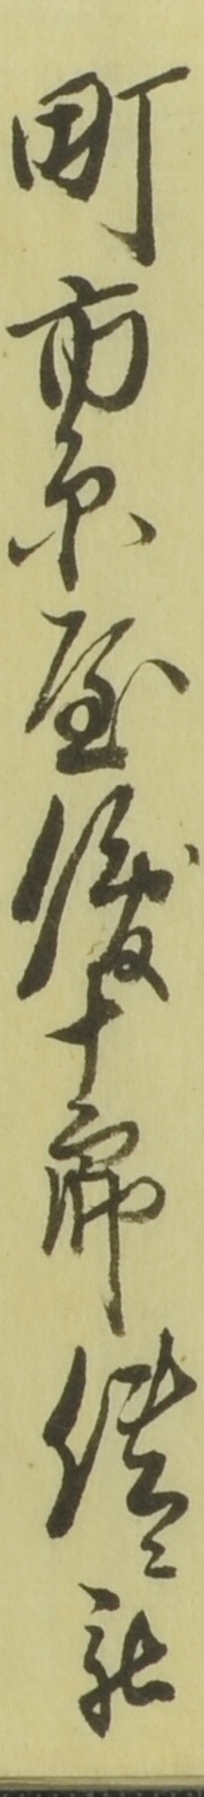町市糸屋俊十郎供ニ被
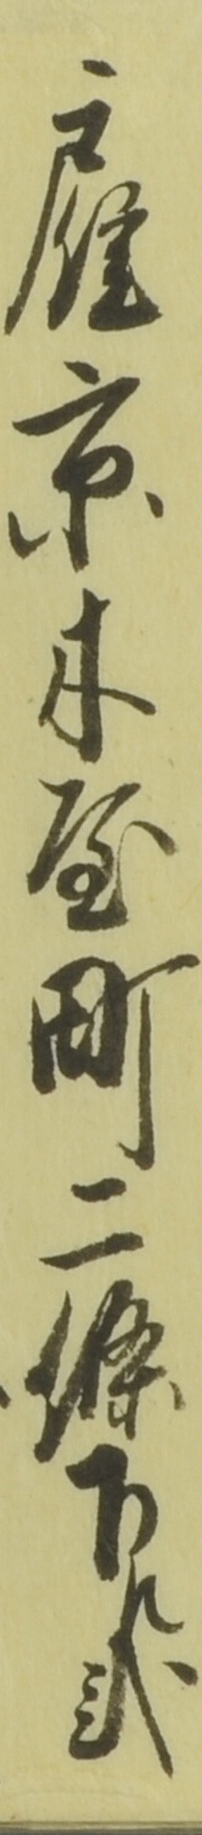雇京木屋町二條下ル弐
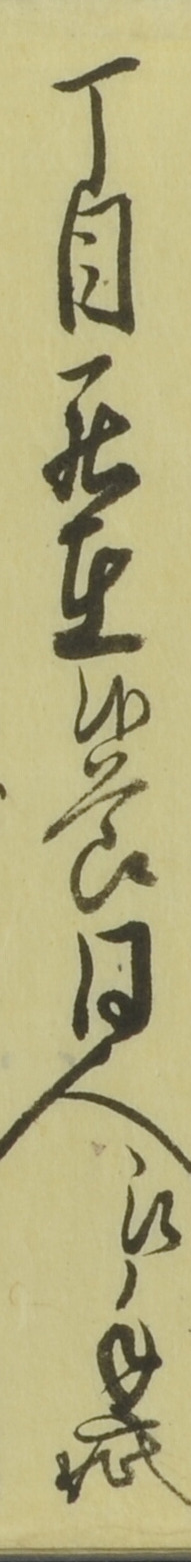丁目罷在候節同人江手疵
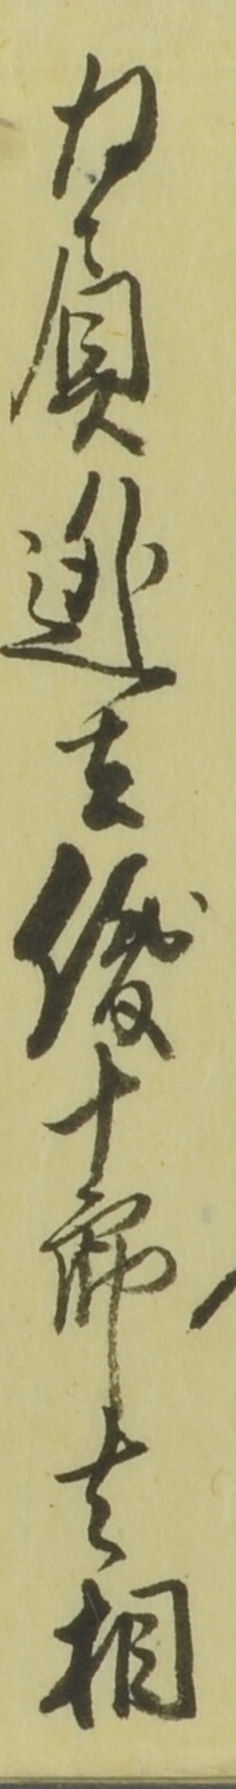為負逃去俊十郎は相
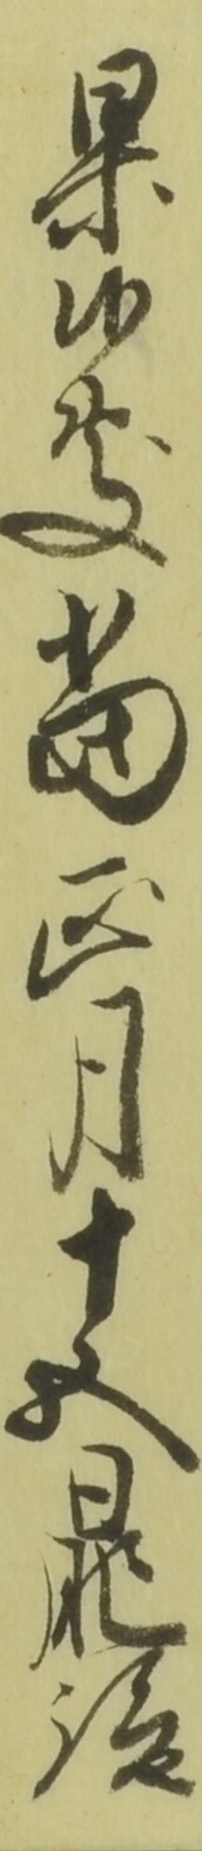果候処当正月十五日肥後
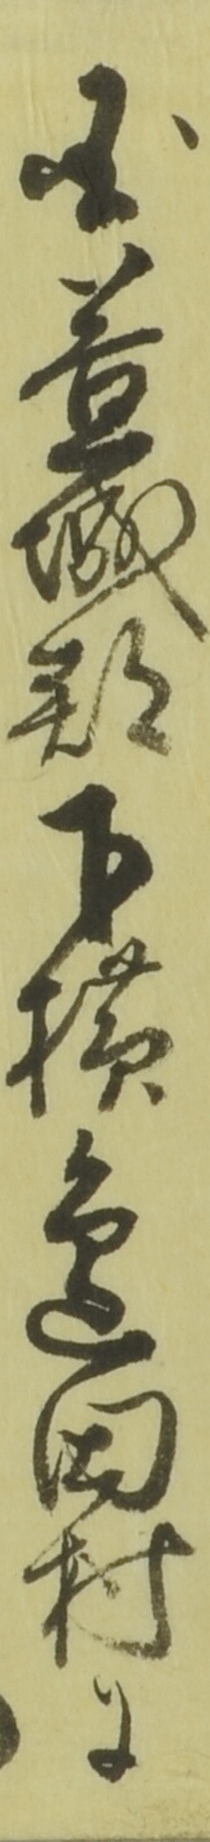国益城郡下横辺田村に
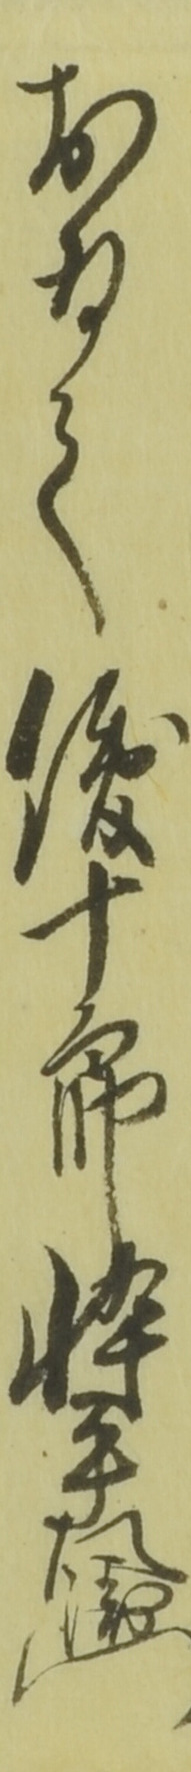おゐて俊十郎忰平左衛門
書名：御触書御書附控
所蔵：伊那市立高遠町図書館・合同会社AMANE
